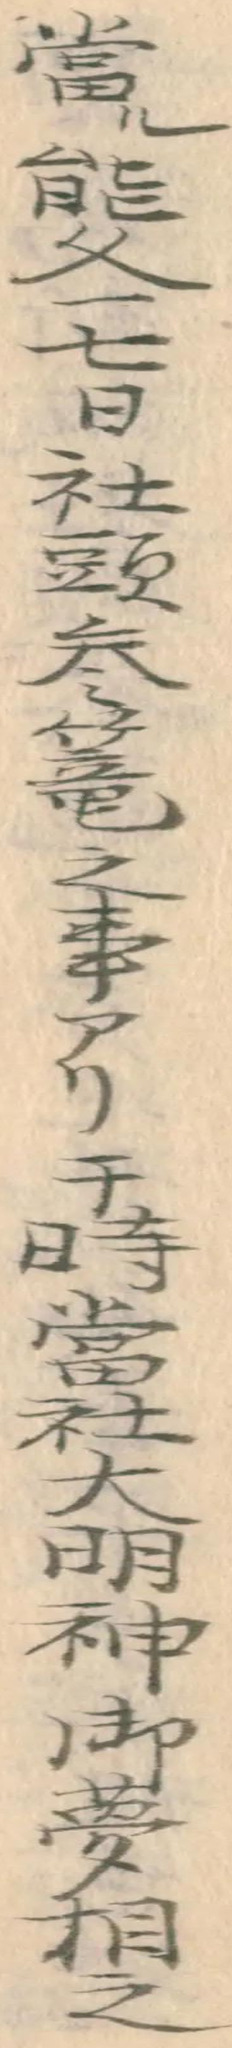当ル能久一七日社頭参篭之事アリ于時当社大明神御夢相之
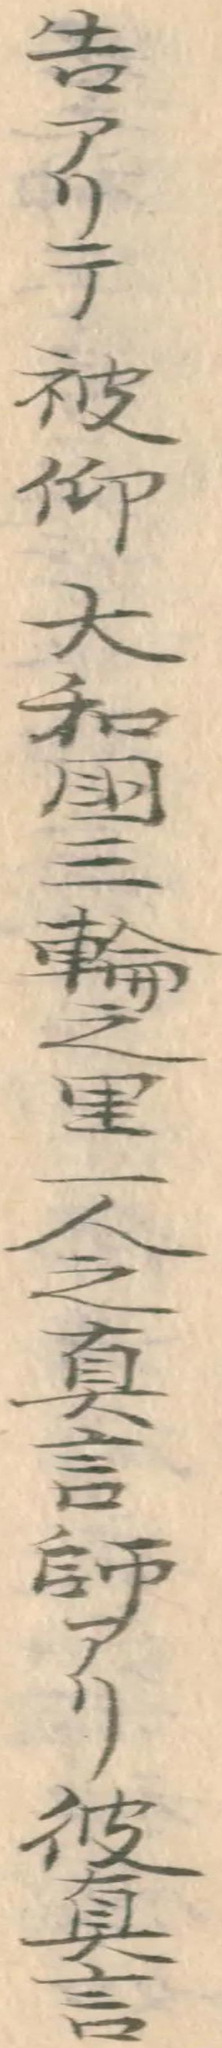告アリテ被仰大和国三輪之里一人之真言師アリ彼真言
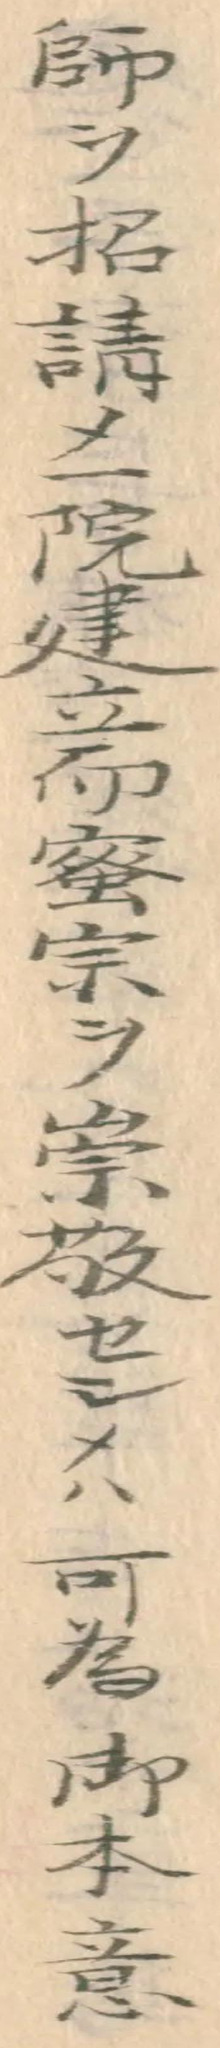師ヲ招請メ一院建立而密宗ヲ崇敬セシメハ可為御本意
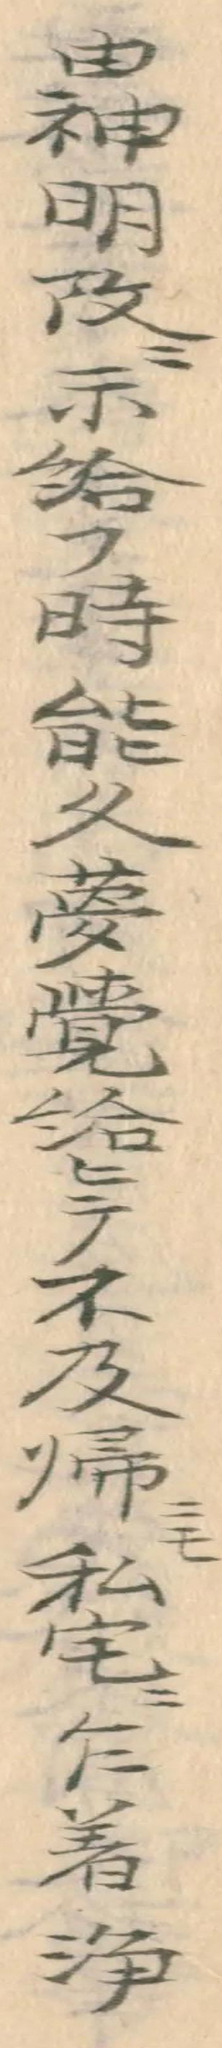由神明改ニ示給フ時能久夢覚給ヒテ不及帰ニモ私宅ニ乍着浄
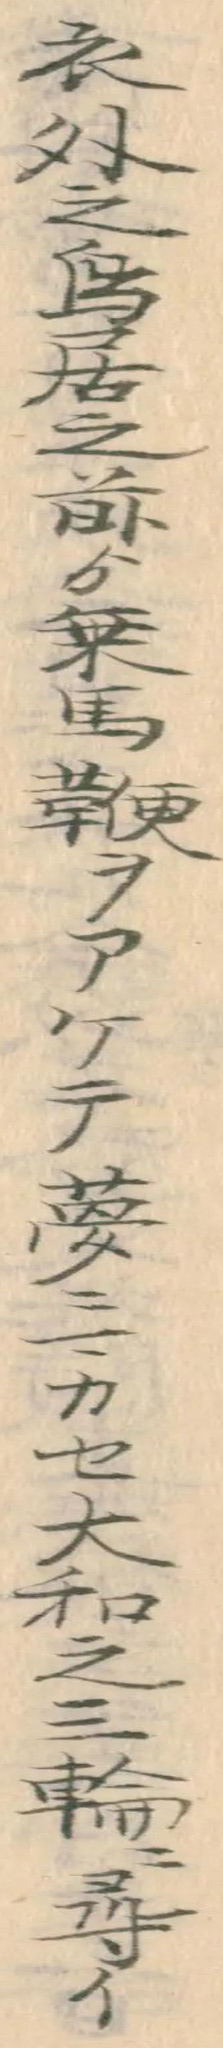衣外之鳥居之前ゟ乗馬鞍ヲアケテ夢ニマカセ大和之三輪ニ尋イ
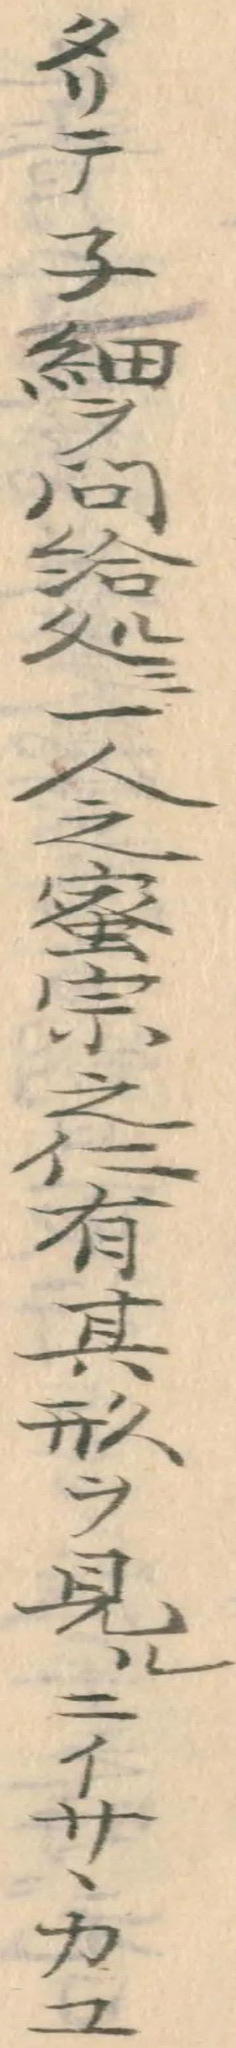タリテ子細ヲ問給処ニ一人之蜜宗之仁有其形ヲ見ルニイサヽカユ
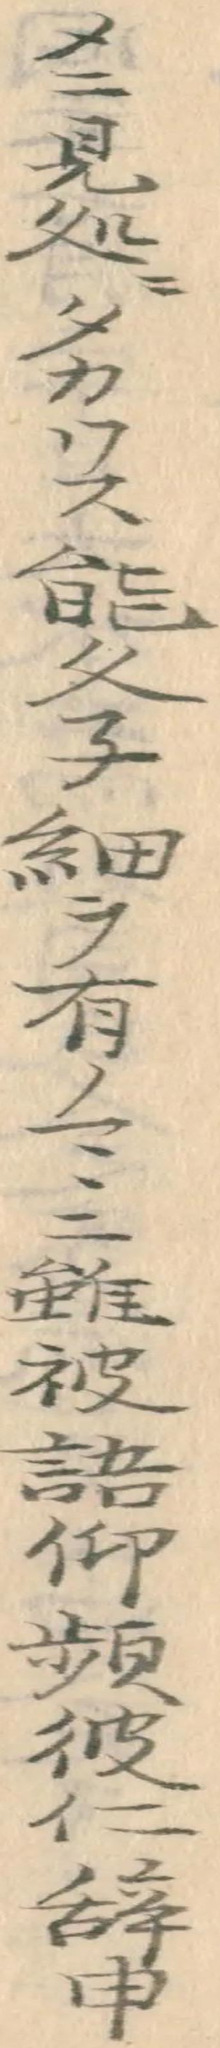メニ見処ニタカワス能久子細ヲ有ノマヽニ雖被仰頻彼仁辞申
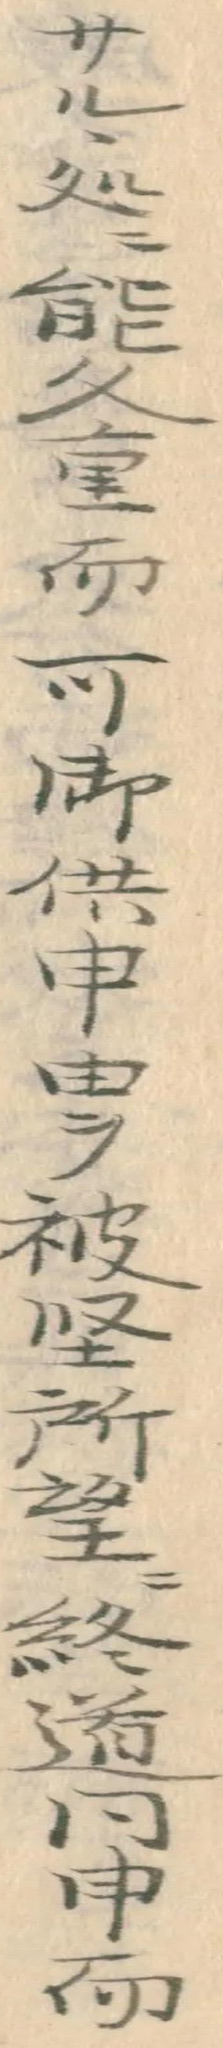サルヽ処ニ能久重而可御供申由ヲ被堅所望ニ終道同申而
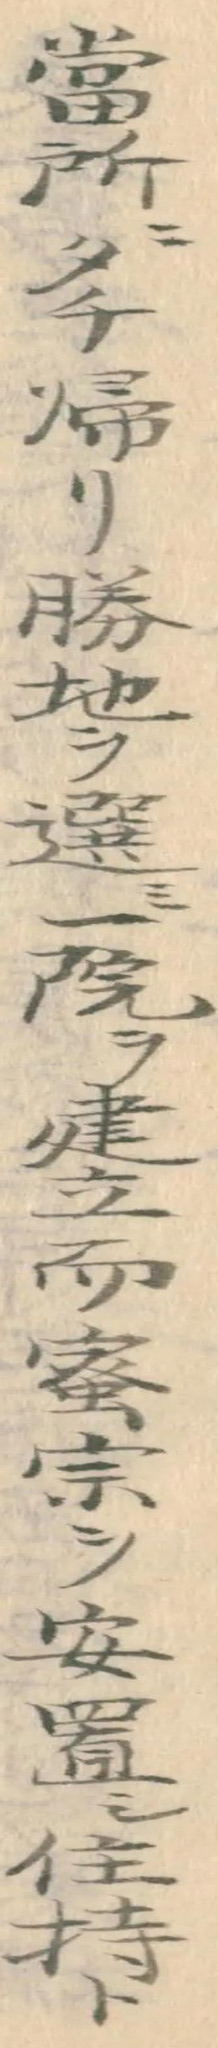当所ニタチ帰リ勝地ヲ選ミ一院ヲ建立而密宗ヲ安置シ住持ト
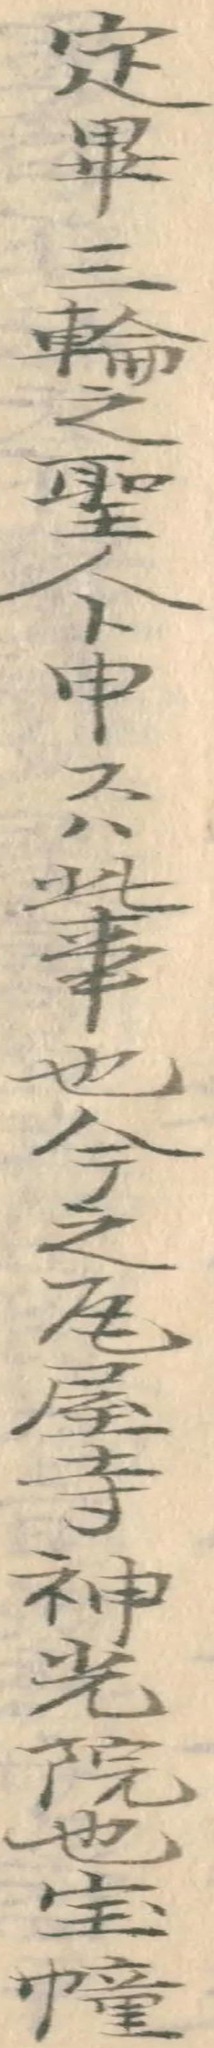定畢三輪之聖人ト申スハ此事也今之瓦屋寺神光院也宝幢
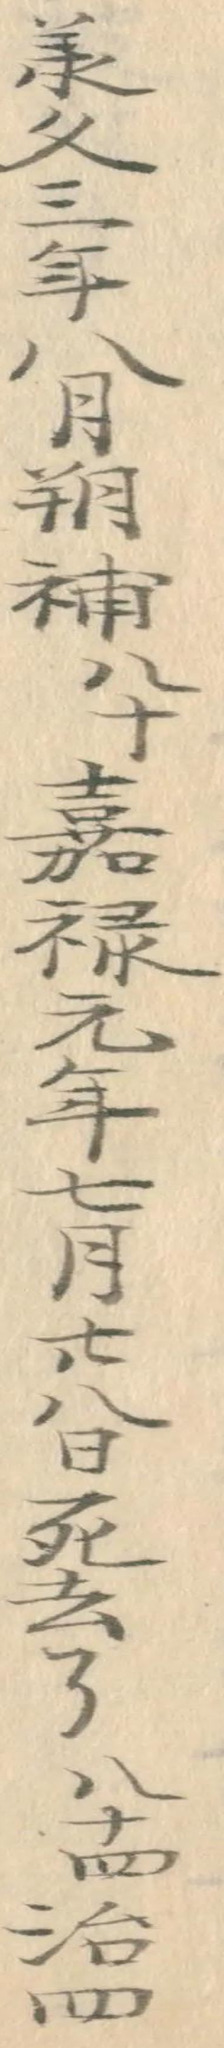承久三年八月朔補八十嘉禄元年七月廿八日死去了八十四治四
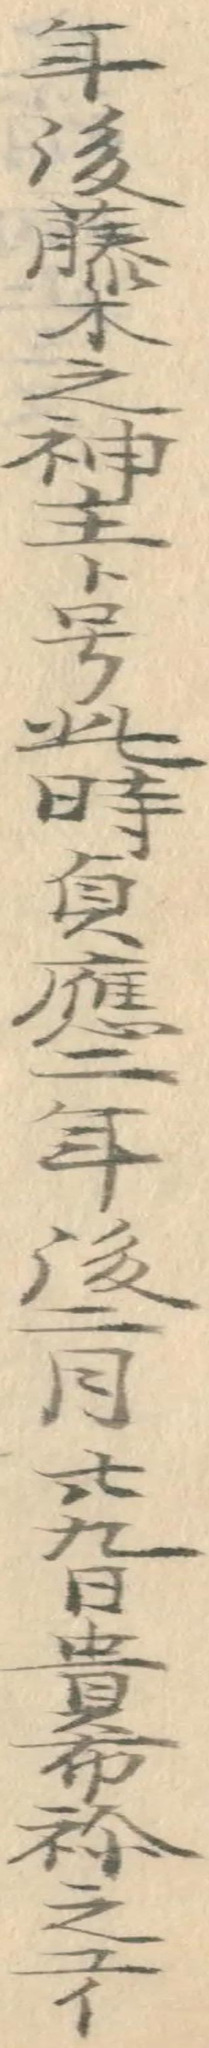年後藤木之神主ト号此時貞応二年後二月廿九日貴布祢之ユイ
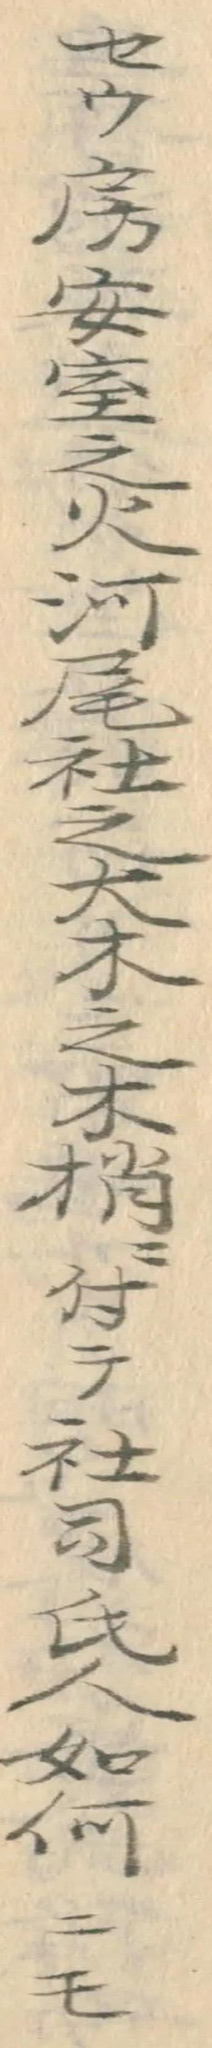セウ房安室之火河尾社之大木之木梢ニ付テ社司氏人如何ニモ

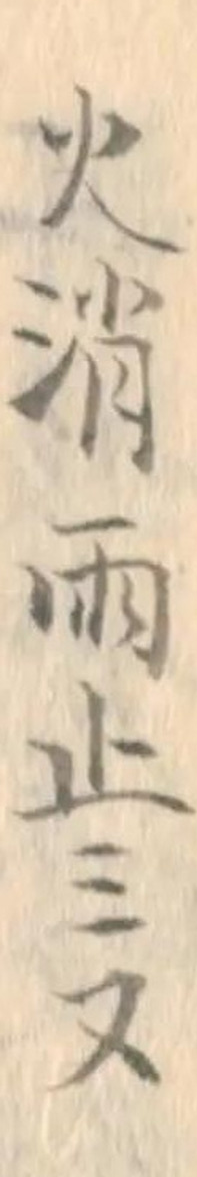火消雨止ミヌ
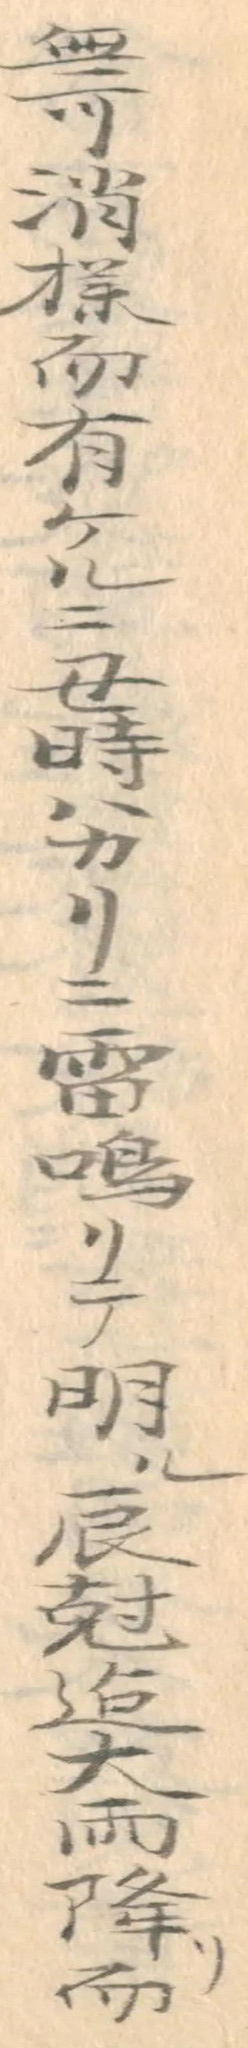無可消様而有ケルニ丑時ハカリニ雷鳴リテ明ル辰尅迄大雨降リ而
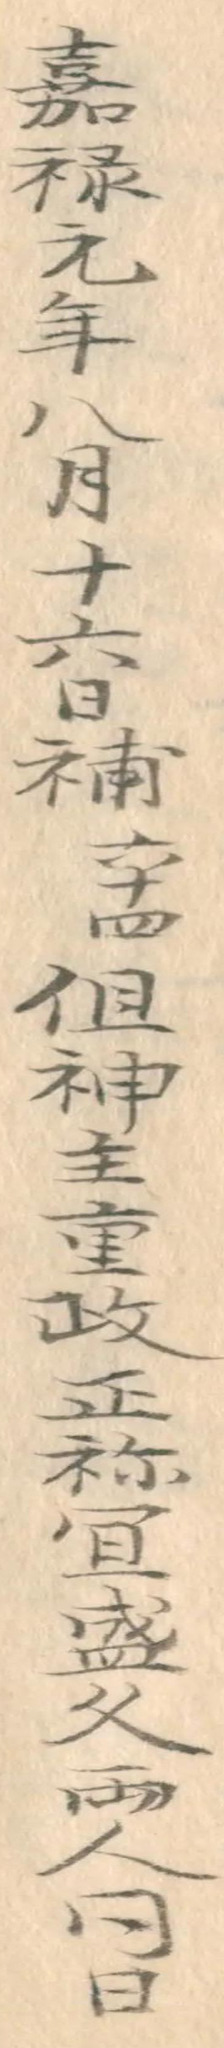嘉禄元年八月十六日補六十四但神主重政正祢宜盛久両人同日
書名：賀茂社記録. 第24冊
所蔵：国立国会図書館 National Diet Library, JAPAN
